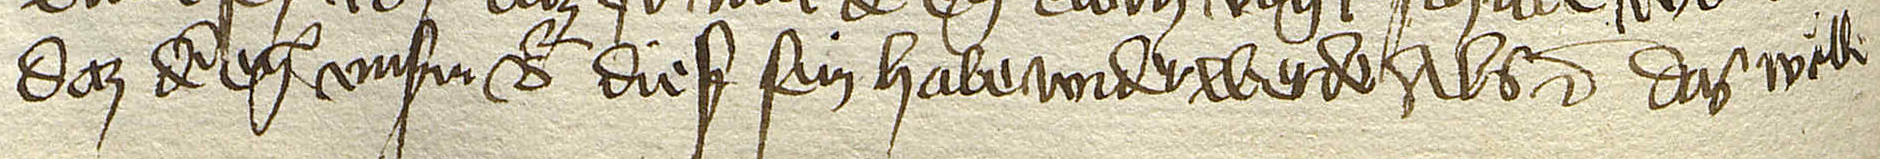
daʒ d* eg* vnſ*m B* dieſ* ſein habe wider werde Als ec* das wölle*
